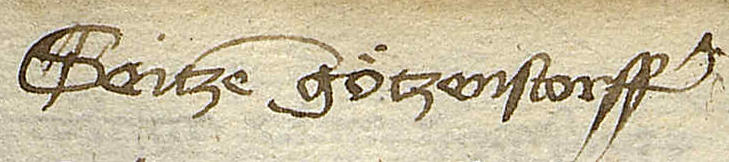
Seicʒe* göcʒenſtorff*
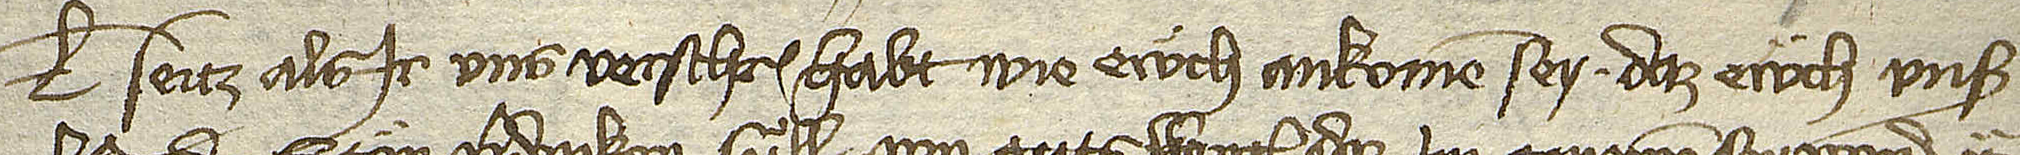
L* ſeicʒ als Ir vns verſchr* habt wie eẅch ankome* ſey . daʒ eẅch vnſ*
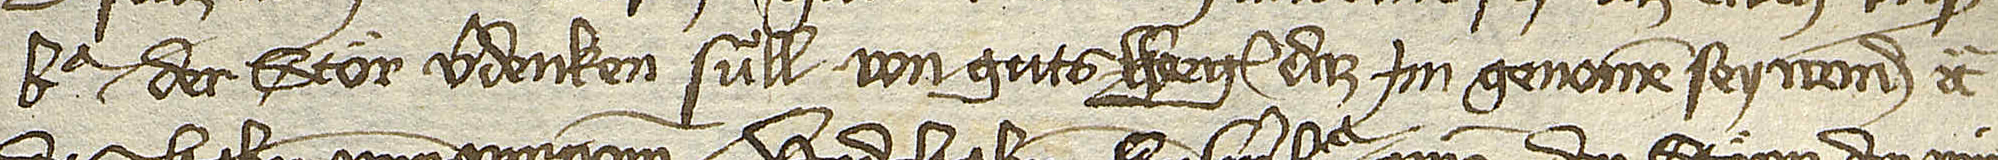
b* / der Stör v*denken ſüll von guts weg* daʒ Im genome* ſey word* ec*
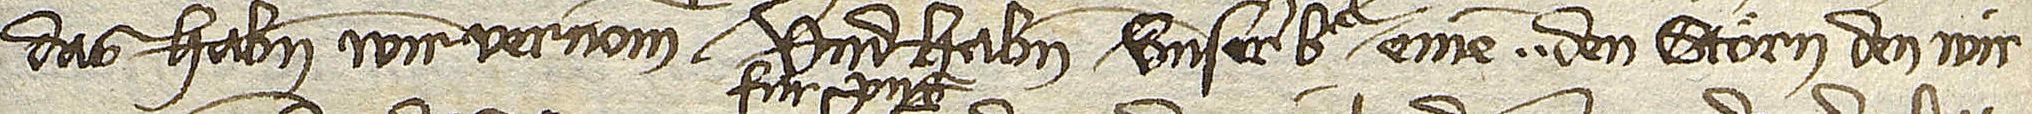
das habn* wir vernom* / Vnd habn* / vnſer* b* / eine* ~ den Störn den wir
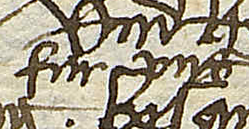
für vns
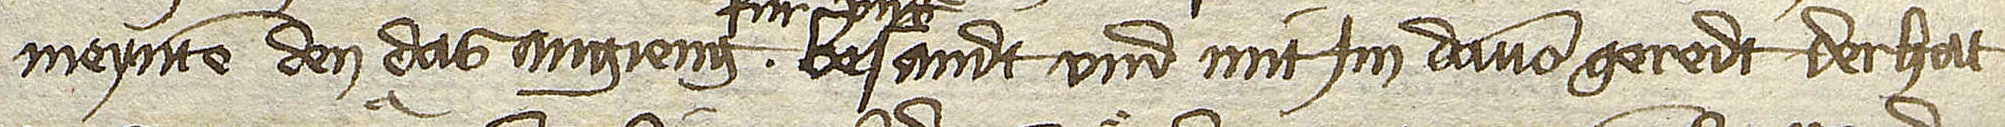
meynte* den das angieng . beſandt vnd mit Im dauo* geredt / der hat
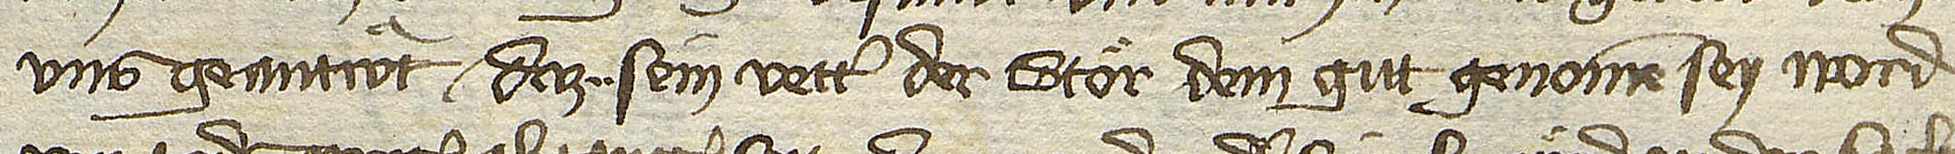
vns geantw*t / daʒ ~ ſein vett* der Stör dem gut genome* ſey word*
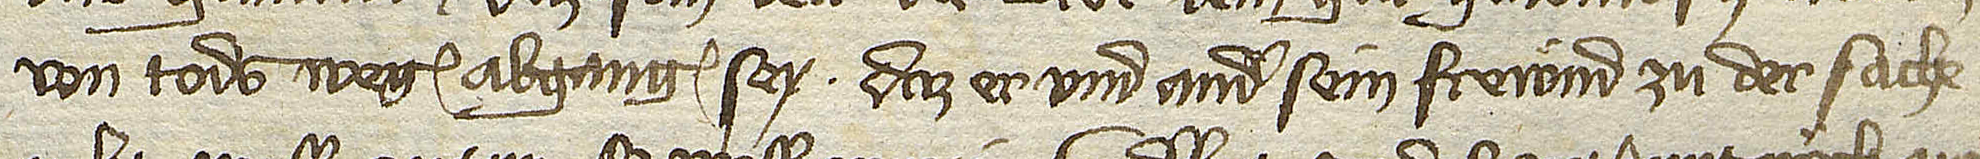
von tods weg* abgang* ſey . daʒ er vnd and* ſein freẅnd ʒu der ſache
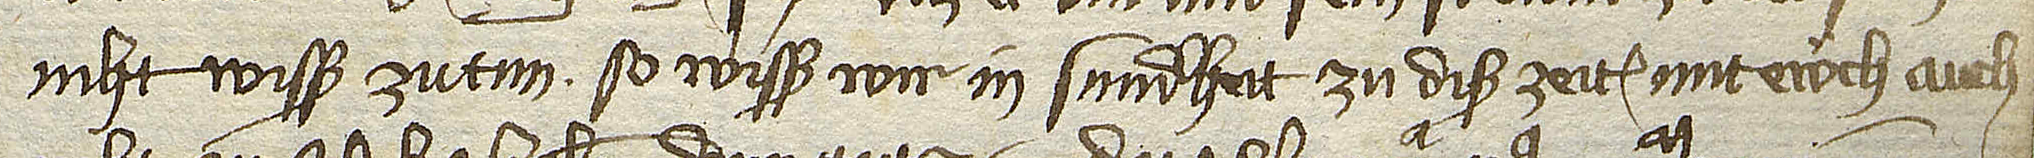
niht wiſſ* ʒutun . ſo wiſſ* wir in ſund*heit ʒu diſ* ʒeit* mit eẅch auch
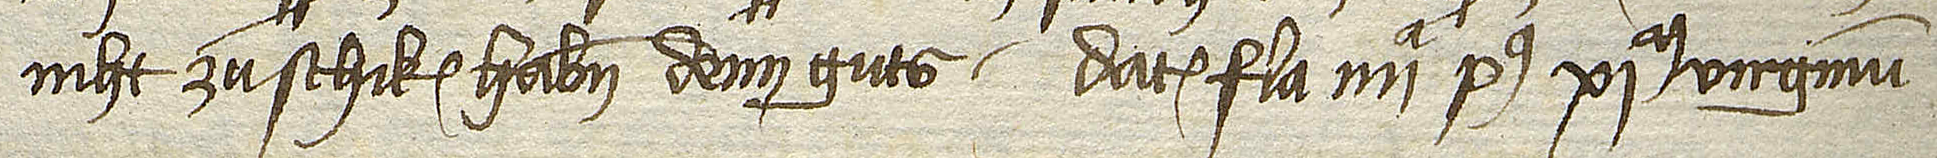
niht ʒu ſchik* habn* denn guts / dat* fi*a iiii* p* xi* virginu*
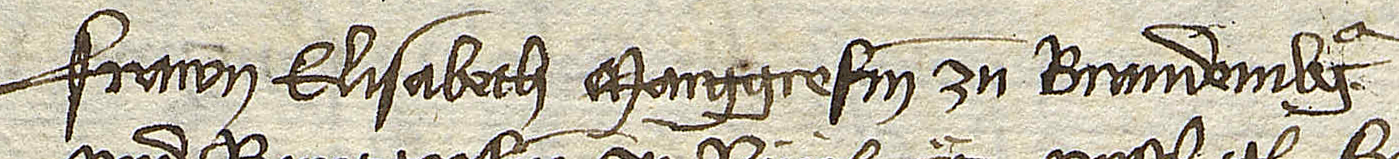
Frawen Eliſabeth Marggrefin* ʒu Brandemb*g
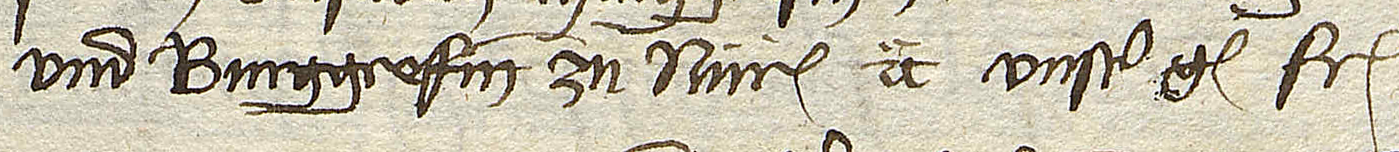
vnd Burggrefin* ʒu Nür* ec* vnſr* g* fr*
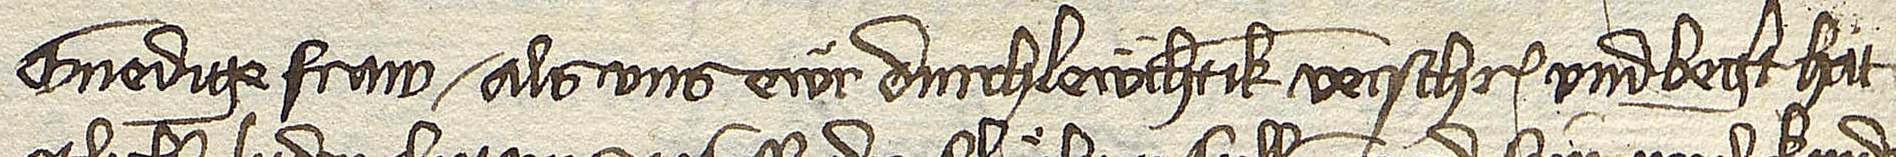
Gnedige fraw / als vns eẅr durchleẅchtik* verſchr* vnd beg*t hat vo*
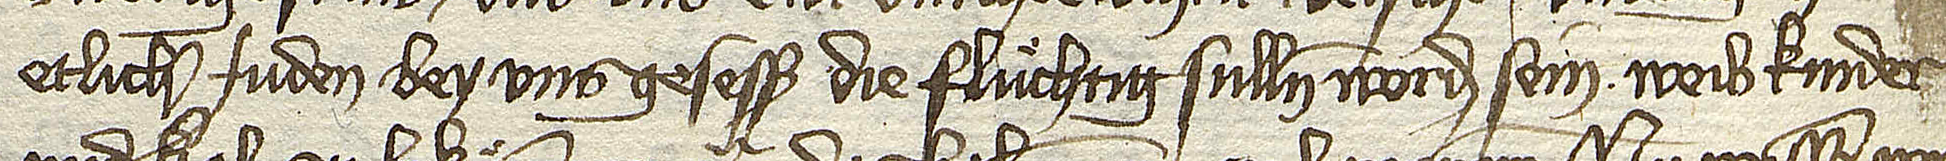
etlich* Iuden / bey vns geſeſſ* die flüchtig ſulln* word* ſein . weib kinder
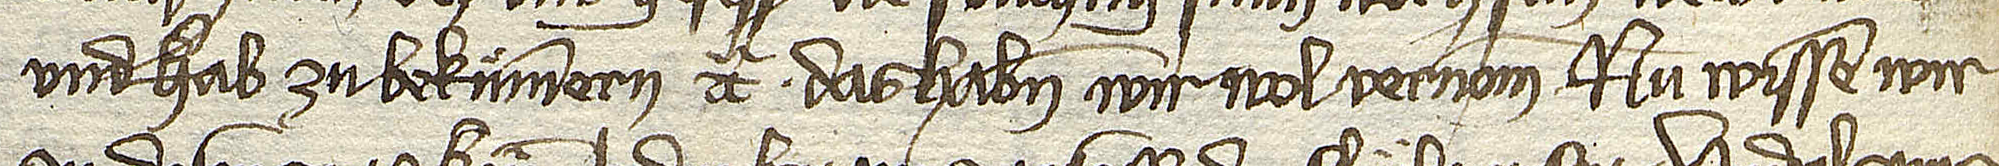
vnd hab ʒu beküm*ern ec* . das habn* wir wol vernom* Nu wiſſe* wir
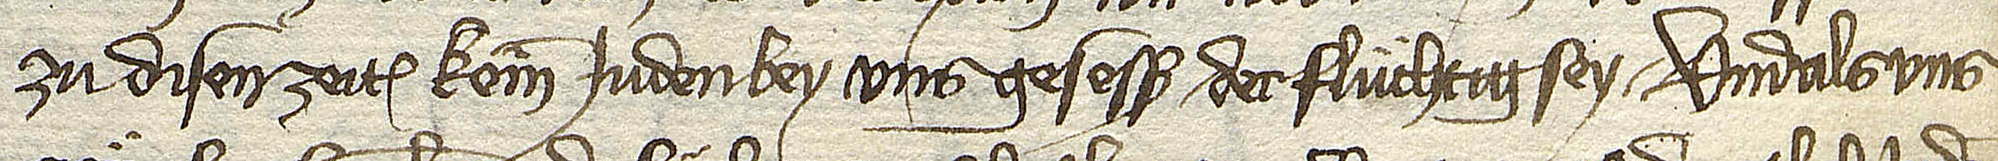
ʒu diſen ʒeit* kein* Iuden bey vns geſeſſ* / der flüchtig ſey / Vnd als vns
